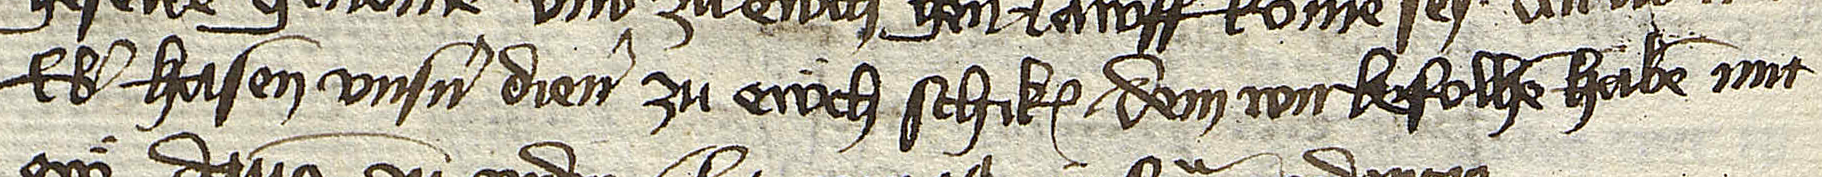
Eb* haſen vnſ*n dien* ʒu eẅch ſchik* / Dem wir befolhe* habe* mit
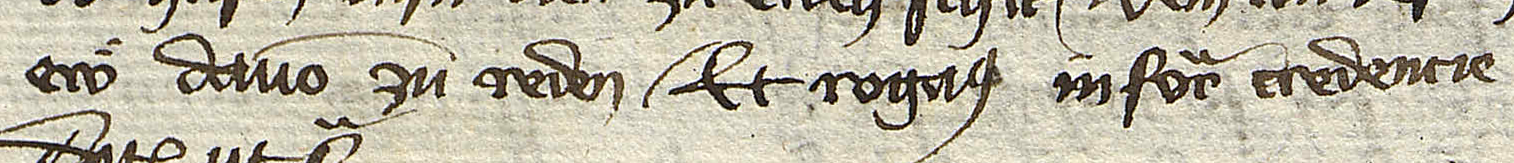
eẅ dauo* ʒu reden / Et roga* in for* credencie
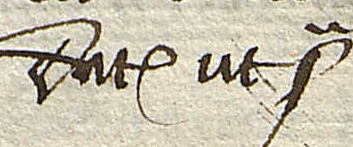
Dat* ut ſ*
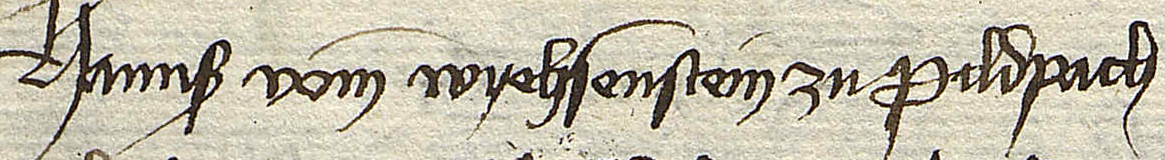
Hannſ* vom wyehſenſtein ʒu Pildpach
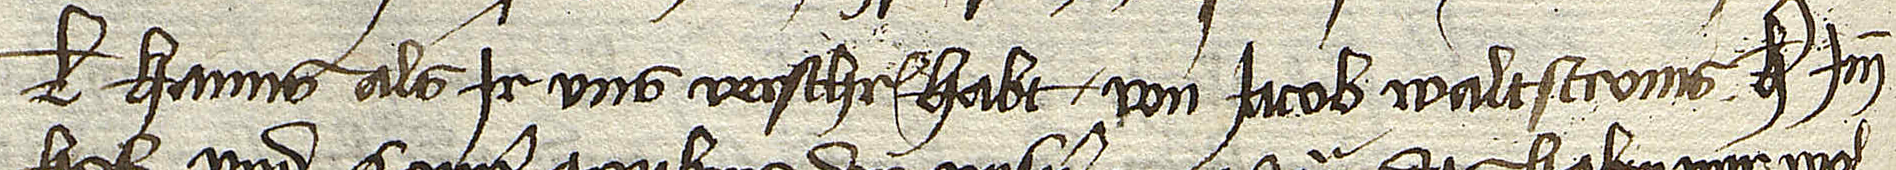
L* hanns als Ir vns verſchr* habt / von Iacob waltſtroms H* Im*
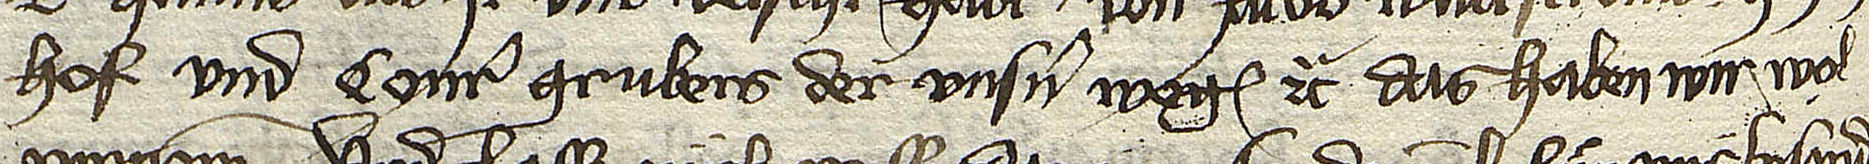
hof vnd Conr* grubers der vnſ*n weg* ec* das haben wir wol
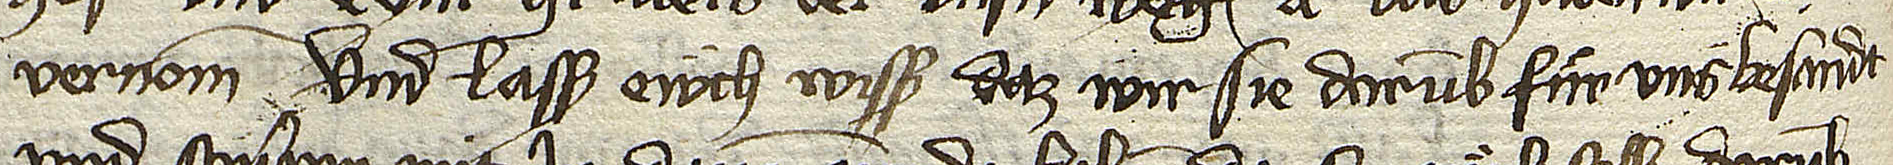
vernom* Vnd laſſ* eẅch wiſſ* daʒ wir ſie darub* für vns beſandt
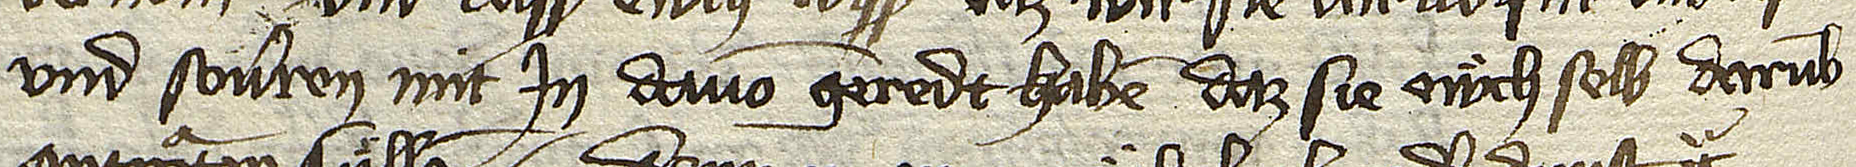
vnd ſou*ren mit In dauo* geredt habe* daʒ ſie eẅch ſelb darub*
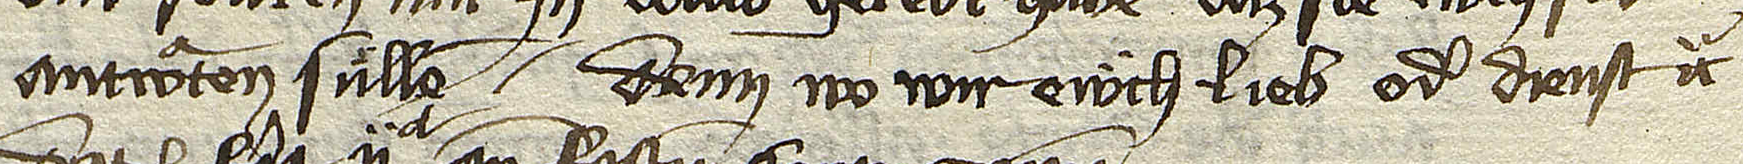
antw*ten ſülle* / Denn wo wir eẅch lieb od* dienſt ec*
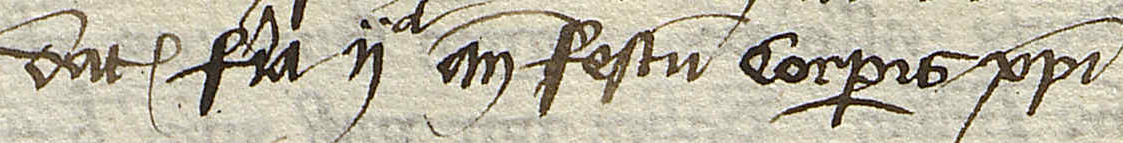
Dat* fia* ii* an* feſtu* Corpis* xpi*
